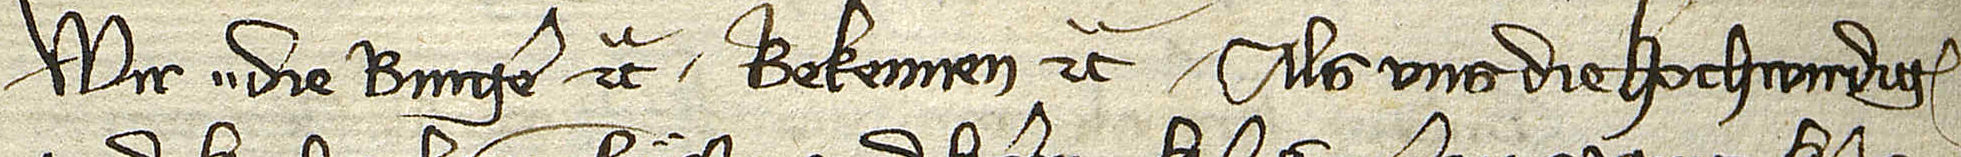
Wir ~ die Burge* ec* / Bekennen ec* / Als vns die Hochwirdig*
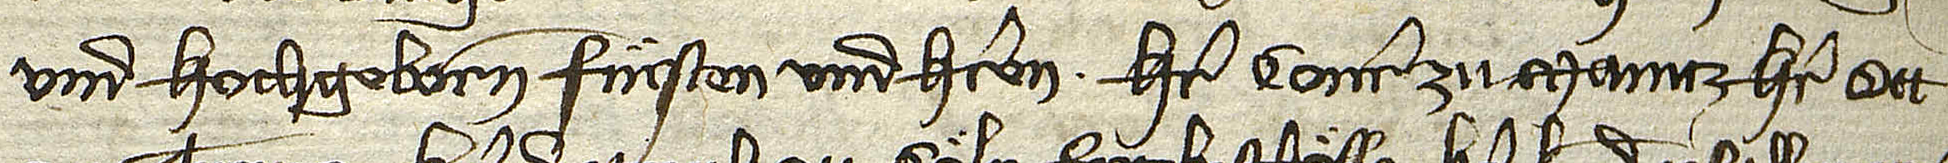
vnd hochgeborn* fürſten vnd h*ren . h*r Conr* ʒu Maincʒ h*r Ott
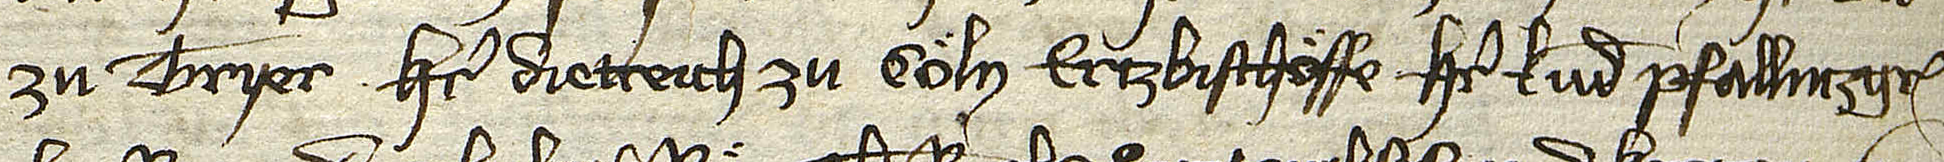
ʒu Tryer . h*r dietreich ʒu Cöln Ercʒbiſchöffe h*r lud* pfallncʒgr*
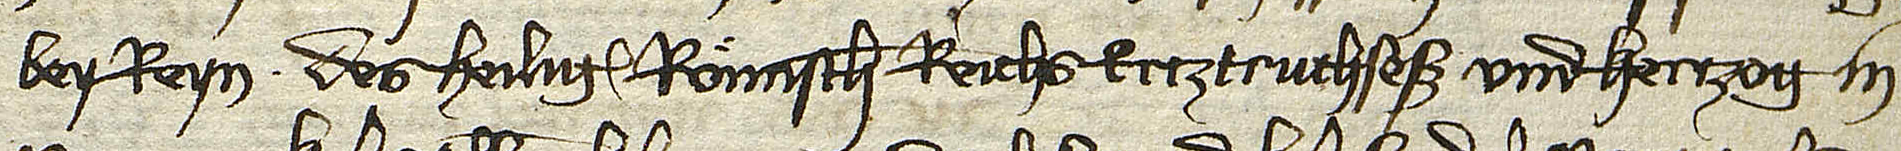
bey Reyn . des heilig* Römiſch* Reichs Ercʒtruchſeſʒ vnd hercʒog in
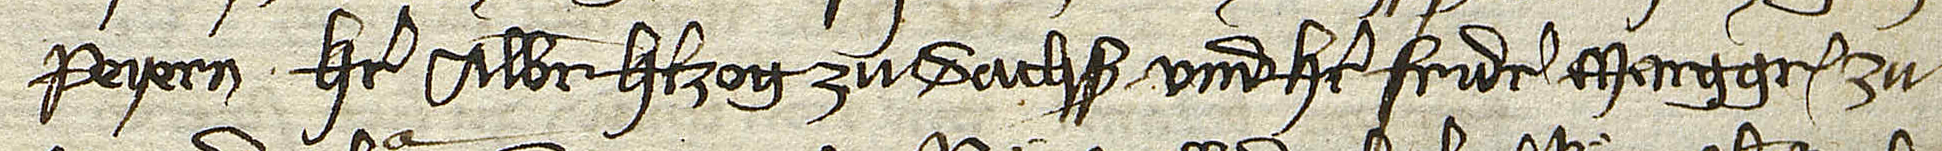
Peyern . h*r Albr* h*cʒog ʒu Sachſ* vnd h*r fridr* Marggr* ʒu
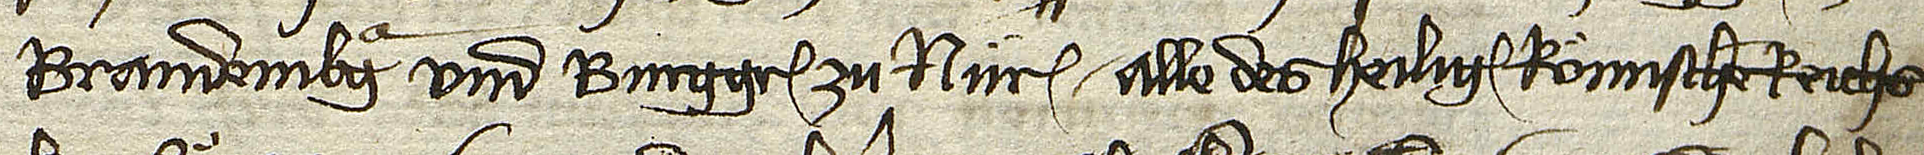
Brandemb*g vnd Burggr* ʒu Nür* / alle des heilig* Römiſche* Reichs
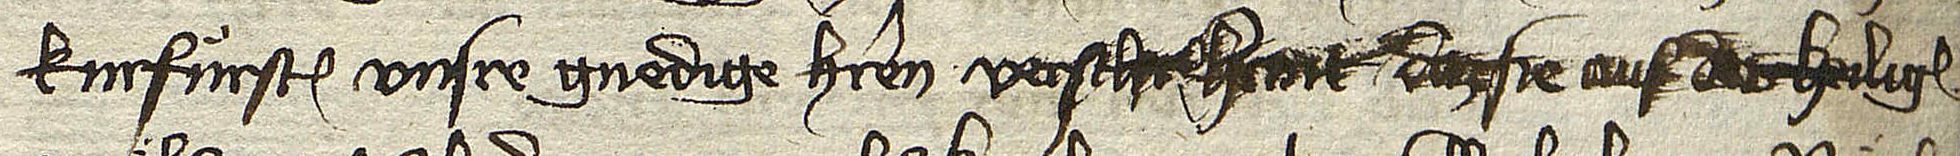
kurfürſt* vnſre gnedige h*ren verſchr* hant / daʒ ſie auf der heilig*
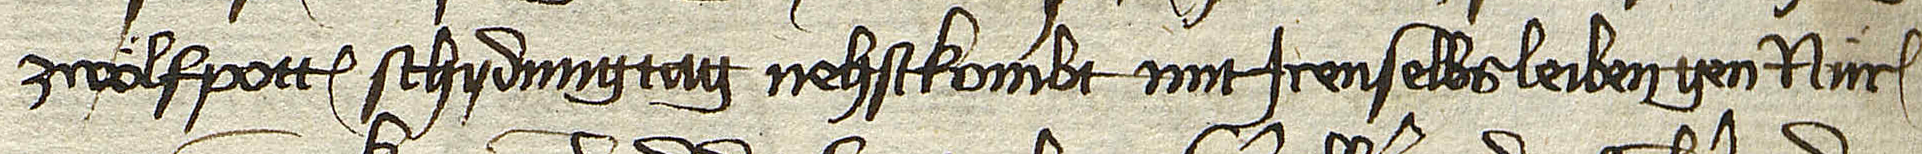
ʒwölfpott* ſchydungtag nehſt kombt mit Iren ſelbs leiben gen Nür*
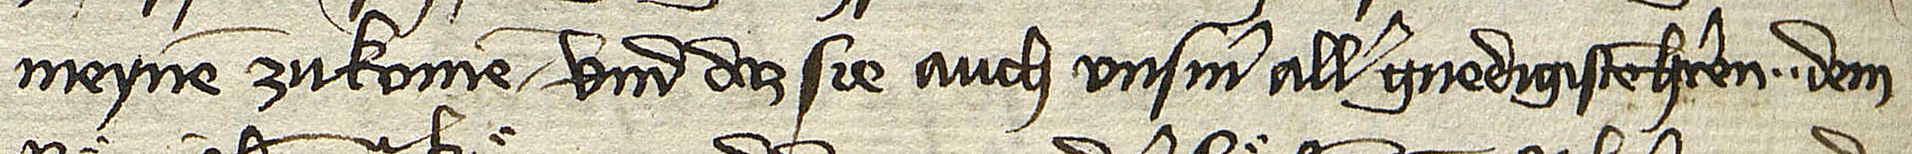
meyne* ʒukome* / Vnd daʒ ſie auch vnſ*m all* gnedigiſte* ~ dem
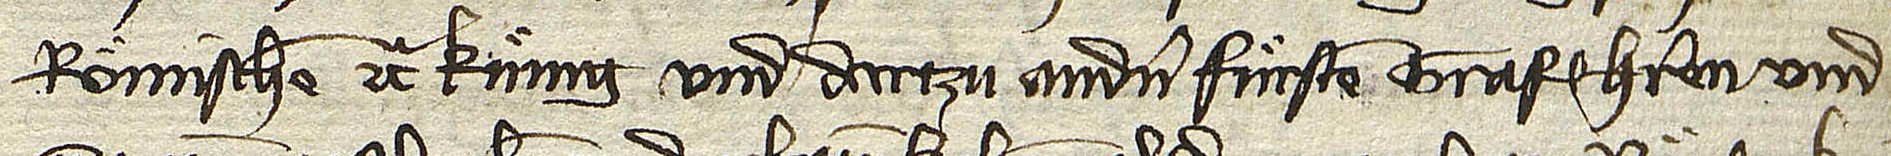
Römiſche* ec* künig vnd darcʒu and*n fürſte* Graf* h*ren vnd
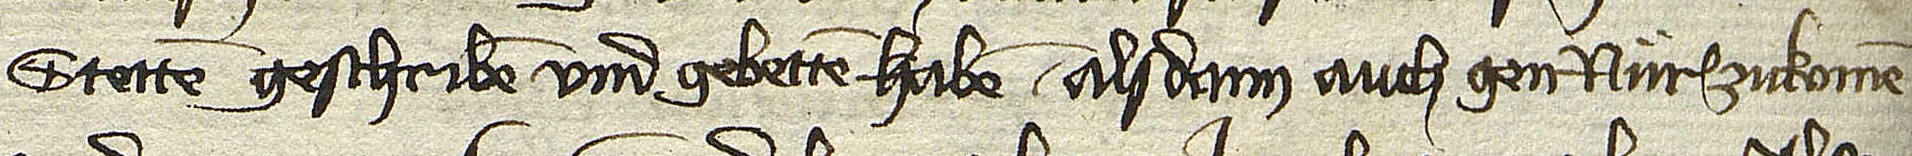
Stette* geſchribe* vnd gebette* habe* / alſdann auch gen Nür* ʒukome*
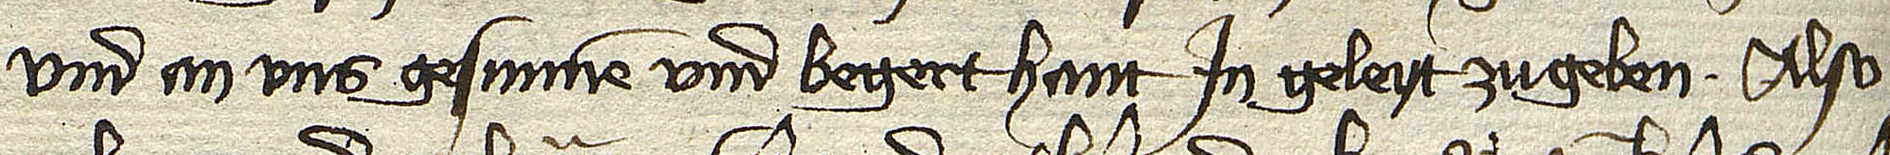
vnd an vns geſunne* vnd begert hant In geleyt ʒugeben . Alſo
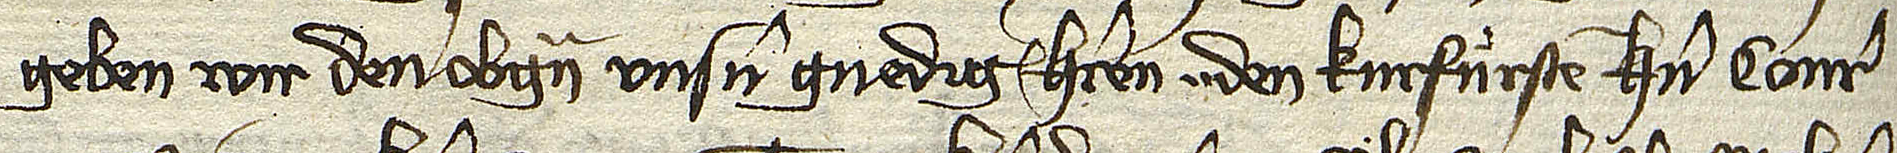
geben wir den obg*n vnſ*n gnedig h*ren ~ den kurfürſte h*n Conr*
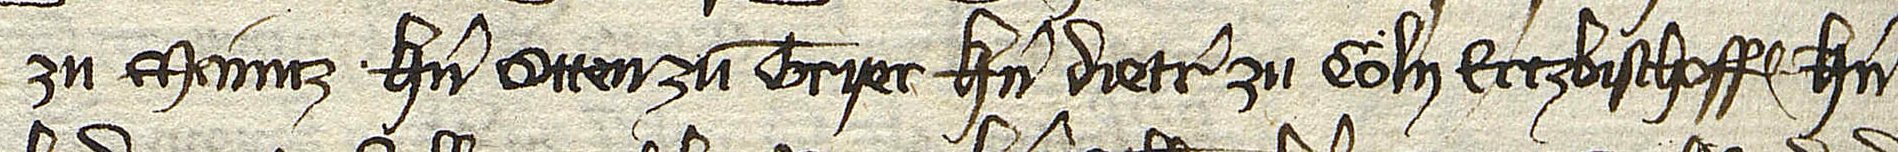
ʒu Maincʒ . h*n Otten ʒu Tryer h*n dietr* ʒu Cöln Ercʒbiſchoff* h*n
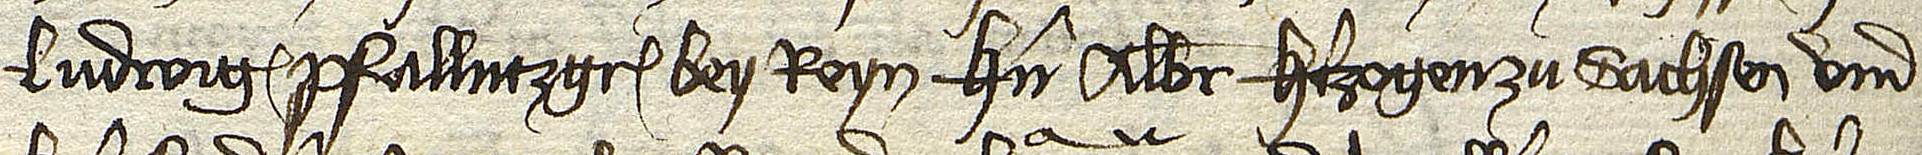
ludwig* pfallncʒgr* bey Reyn h*n Albr* h*cʒogen ʒu Sachſen Vnd
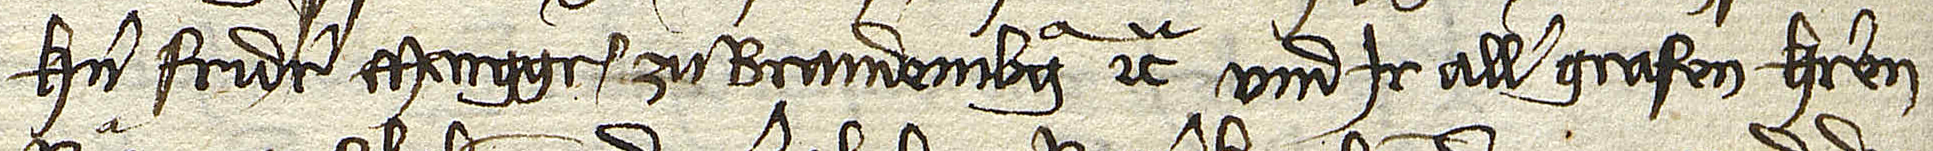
h*n fridr* Marggr* ʒ Brandemb*g ec* vnd Ir all* grafen h*ren
